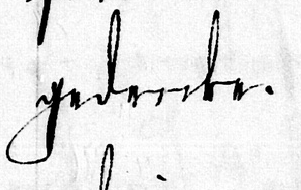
gedenke.
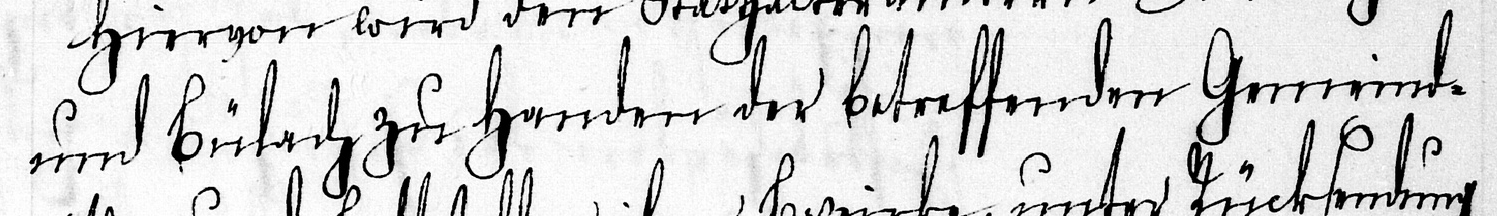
und Bülach zu Handen der betreffenden Gemeind¬
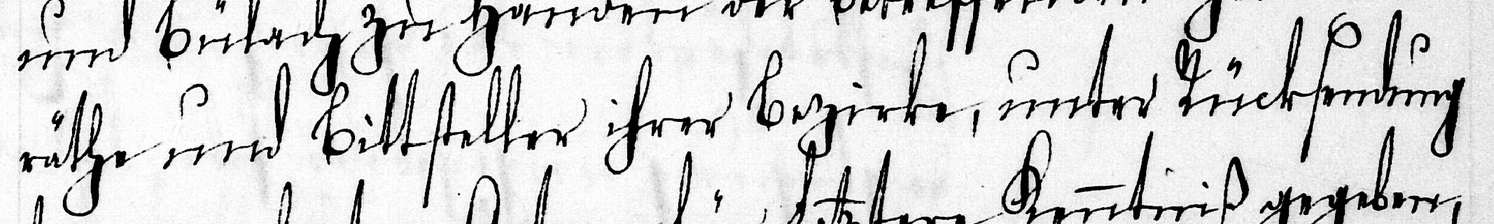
räthe und Bittsteller ihrer Bezirke, unter Rücksendung
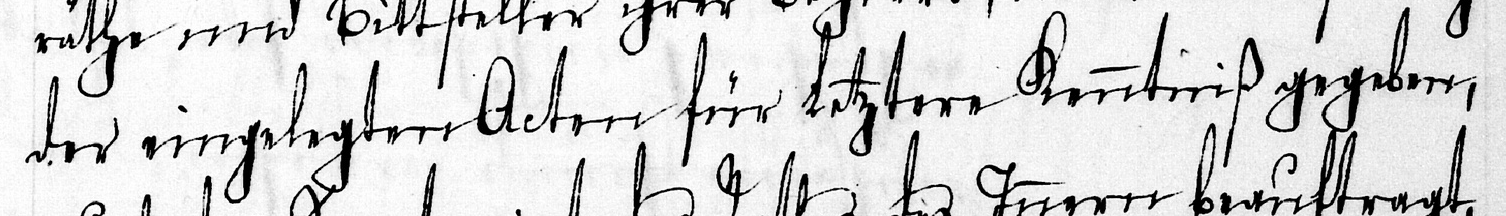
der eingelegten Acten für Letztere Kenntniß gegeben,
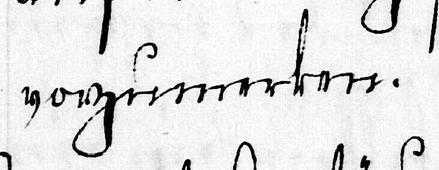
vorzumerken.
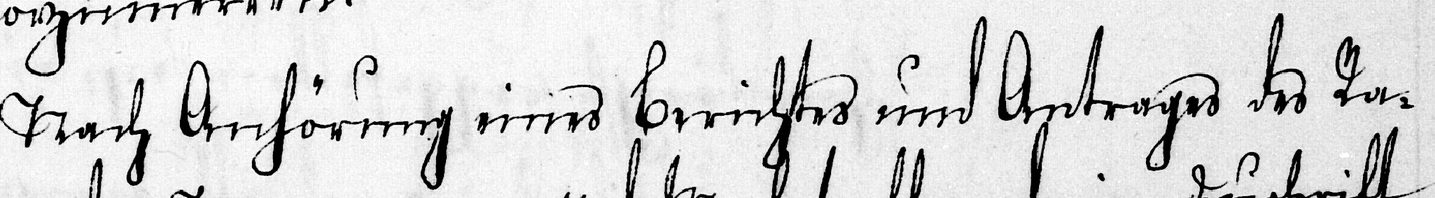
Nach Anhörung eines Berichtes und Antrages des Ra¬
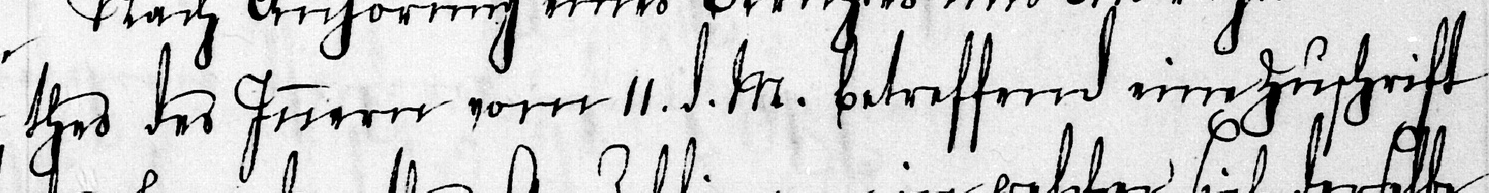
thes des Innern vom 11. d. M. betreffend eine Zuschrift
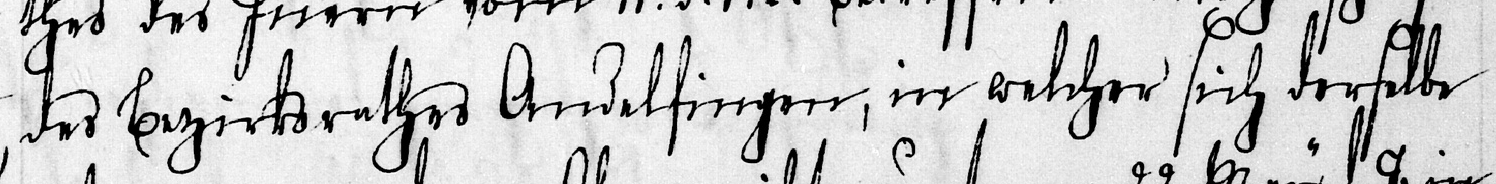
des Bezirksrathes Andelfingen, in welcher sich derselbe
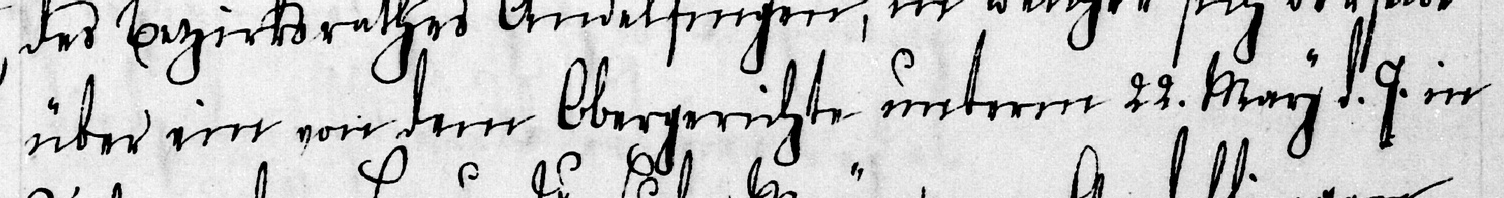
über ein von dem Obergerichte unterm 22. May d. J. in
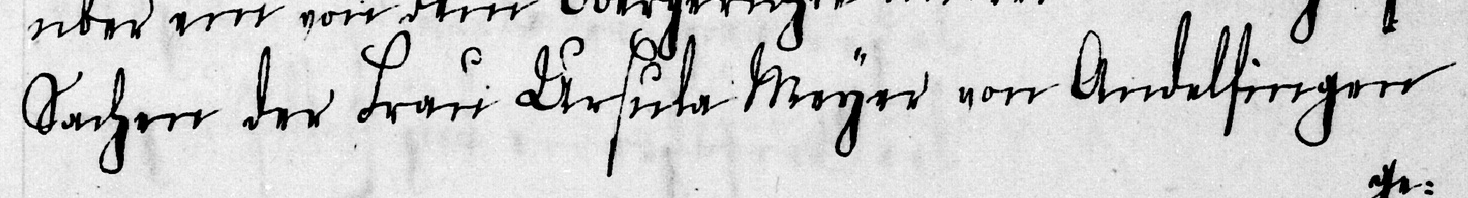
Sachen der Frau Ursula Meyer von Andelfingen
